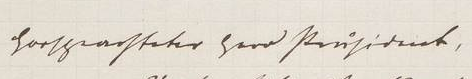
Hochgeachteter Herr Präsident,
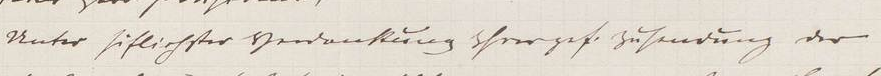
Unter höflichster Verdankung Ihrer gef. Zusendung der
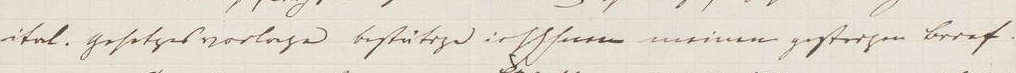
ital. Gesetzesvorlage bestätige ich Ihnen meinen gestrigen Brief.
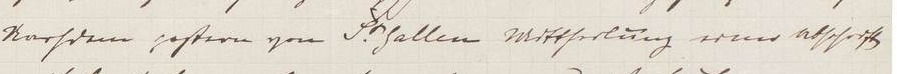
Nachdem gestern von St Gallen Mittheilung einer Abschrift
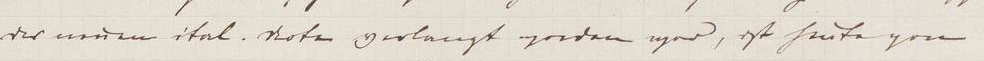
der neuen ital. Note verlangt worden war, ist heute von
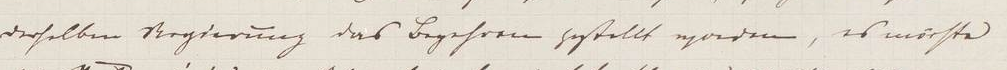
derselben Regierung das Begehren gestellt worden, es möchte
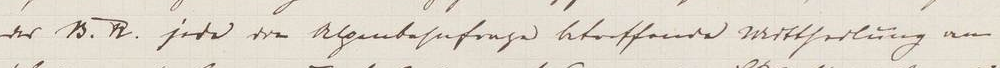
der B.R. jede die Alpenbahnfrage betreffende Mittheilung an
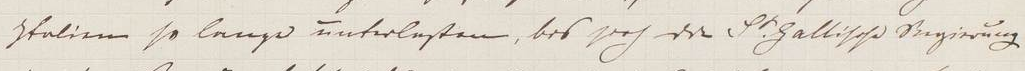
Italien so lange unterlaßen, bis sich die St Gallische Regierung
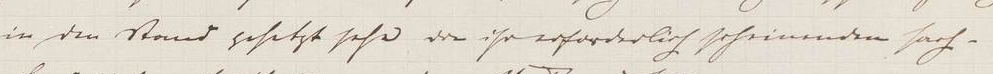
in den Stand gesetzt sehe die ihr erforderlich scheinenden sach-
